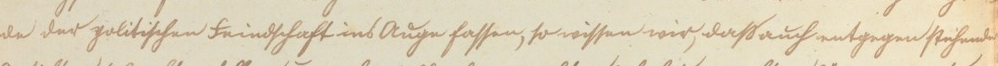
de der politischen Feindschaft ins Auge fassen, so wissen wir, dass auch entgegen stehende
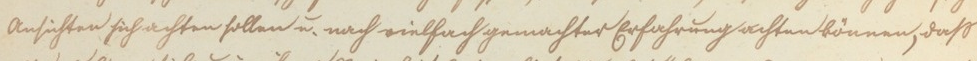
Ansichten sich achten sollen u. nach vielfach gemachter Erfahrung achten können, dass
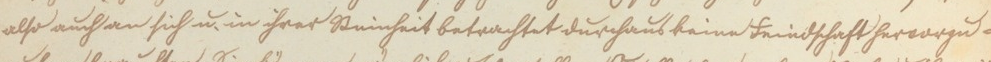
also auch an sich u. in ihrer Reinheit betrachtet durchaus keine Feindschaft hervorzu-
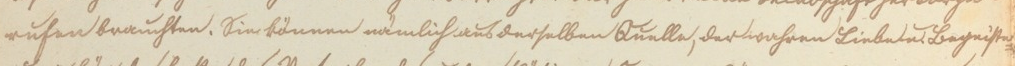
rufen brauchten. Sie können nämlich aus derselben Quelle, der wahren Liebe u. Begeiste-
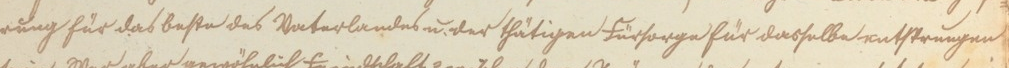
rung für das beste des Vaterlandes u. der thätigen Fürsorge für dasselbe entsprungen
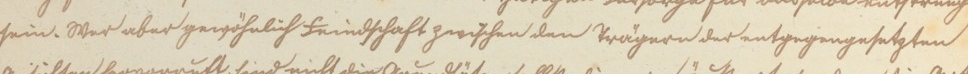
sein. Wer aber gewöhnlich Feindschaft zwischen den Trägern der entgegengesetzten
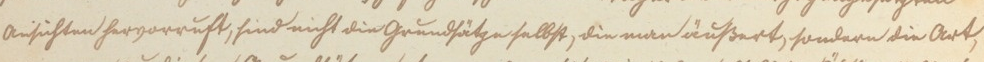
Ansichten hervorruft, sind nicht die Grundsätze selbst, die man äußert, sondern die Art,
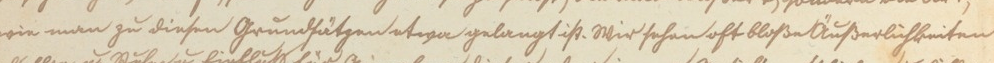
wie man zu diesen Grundsätzen etwa gelangt ist. Wir sehen oft bloße Äußerlichkeiten
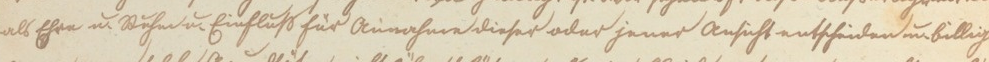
als Ehre u. Ruhm u. Einfluss für Annahme dieser oder jener Ansicht entscheiden u. billig
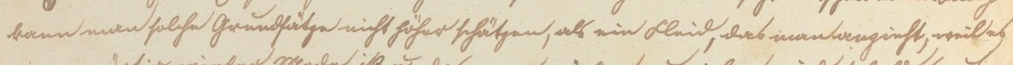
kann man solche Grundsätze nicht höher schätzen, als ein Kleid, das man anzieht, weil es
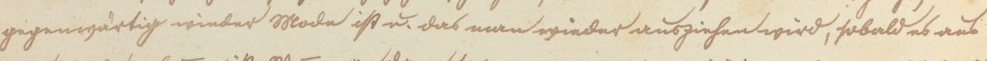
gegenwärtig wieder Mode ist u. das man wieder ausziehen wird, sobald es aus
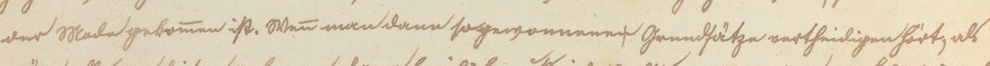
der Mode gekommen ist. Wenn man dann so gewonnene Grundsätze vertheidigen hört, als
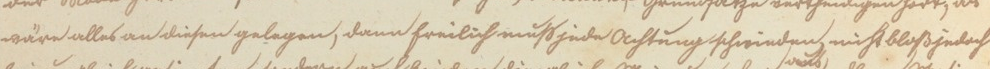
wäre alles an diesen gelegen, dann freilich muss jede Achtung schwinden, nicht bloß jedoch
